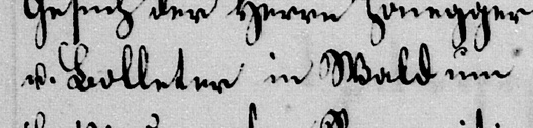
u. Bolleter in Wald um
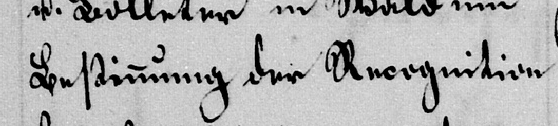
Bestimmung der Recognition
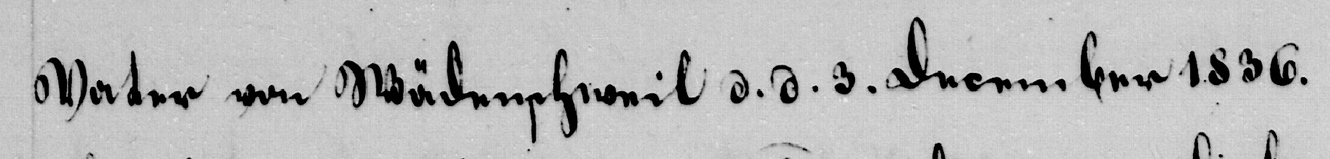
Vater von Wädenschweil d. d. 3. December 1836.
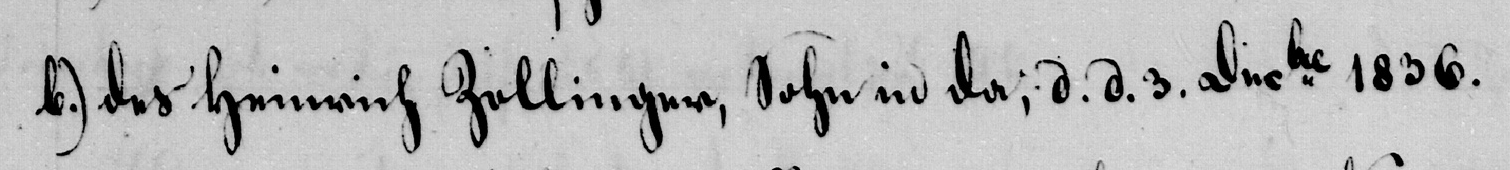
b.) des Heinrich Zollinger, Sohn in da, d. d. 3. Decbre 1836.
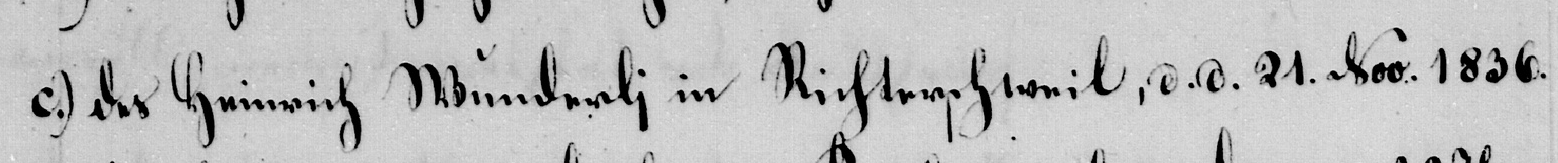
c.) des Heinrich Wunderli in Richterschweil, d. d. 21. Nov. 1836.
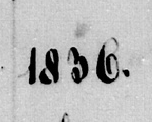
1836.
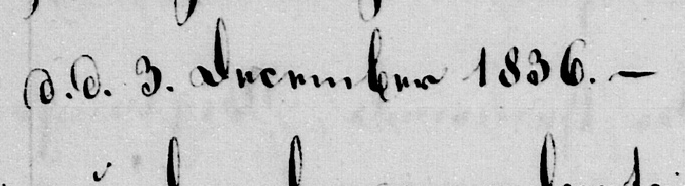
d. d. 3. December 1836. –
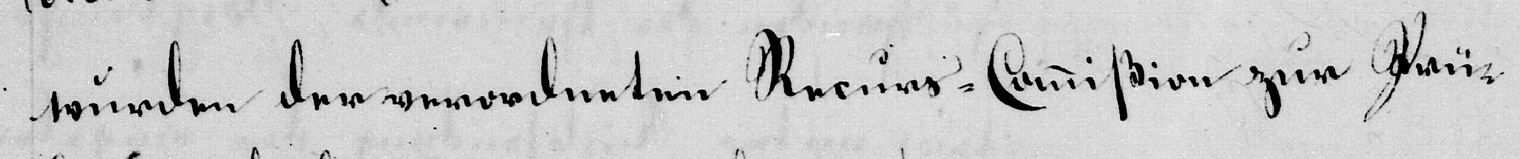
wurden der verordneten Recurs-Commißion zur Prü¬
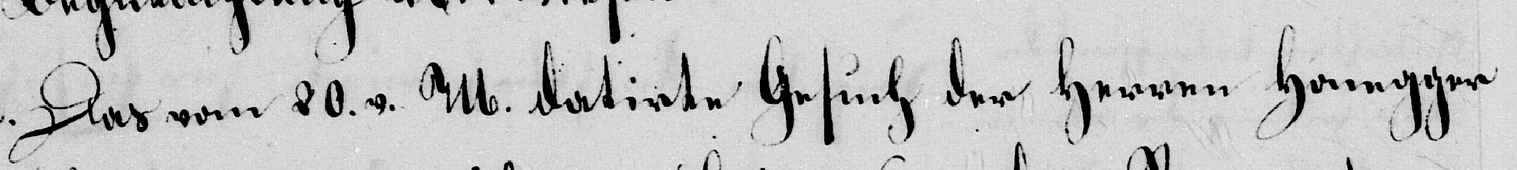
Das vom 20. v. M. datirte Gesuch der Herren Honegger
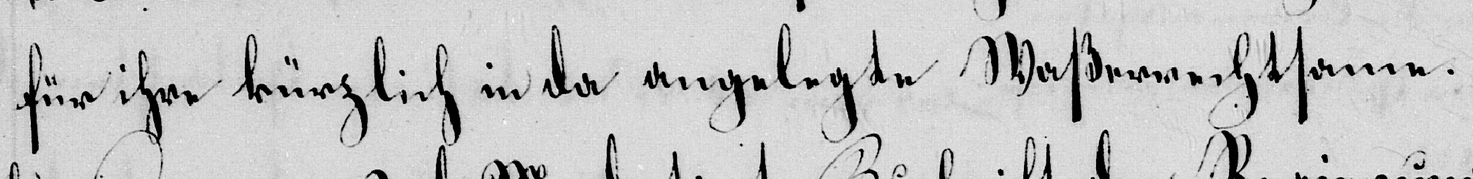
für ihre kürzlich in da angelegte Waßerrechtsame.
